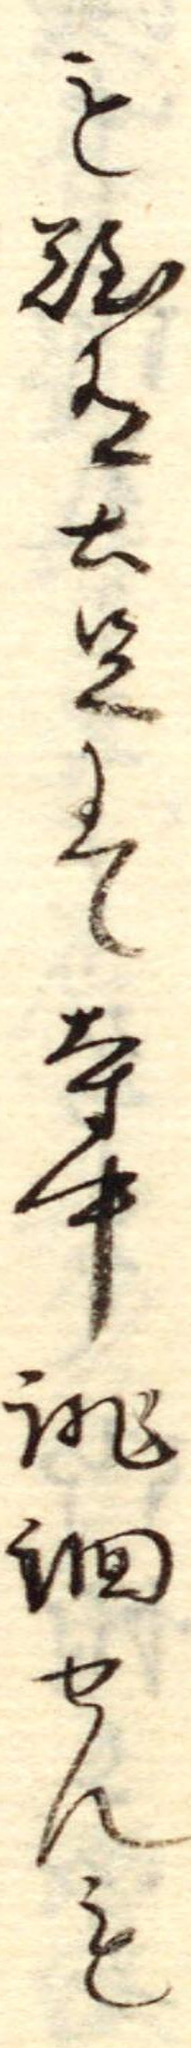も難有土足にて寺中徘徊せんも
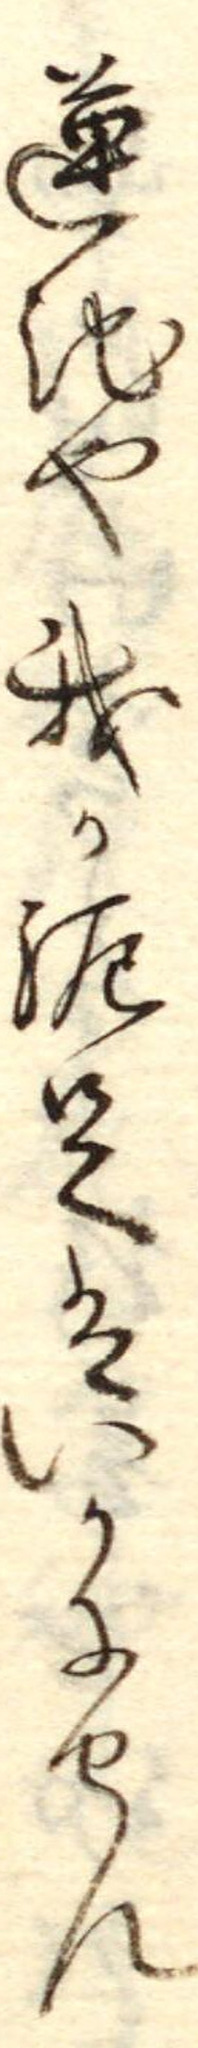蓮池や我か振足はいかにせん
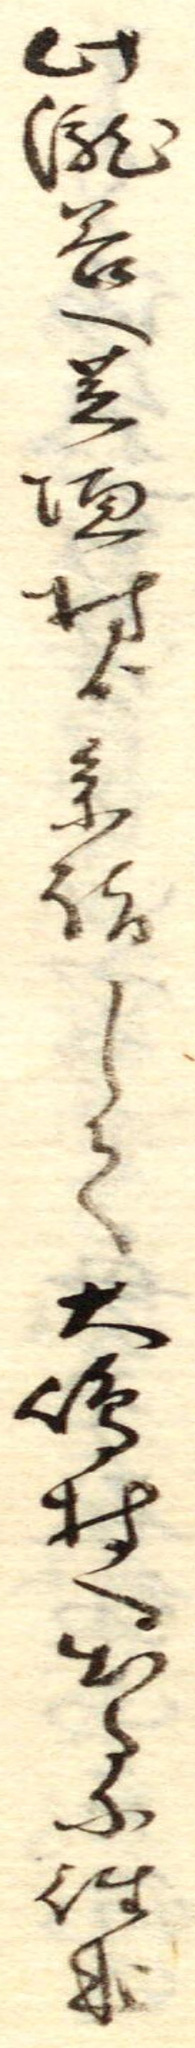此瀧谷へ芝垣村ゟ参詣して大嶋村へ出るに往来
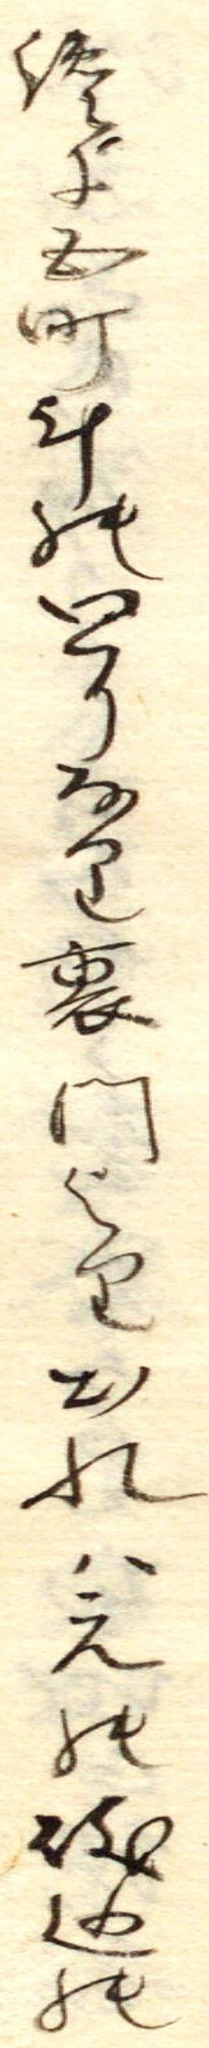纔に五町計の廻りなり裏門より出れは元の礒辺の
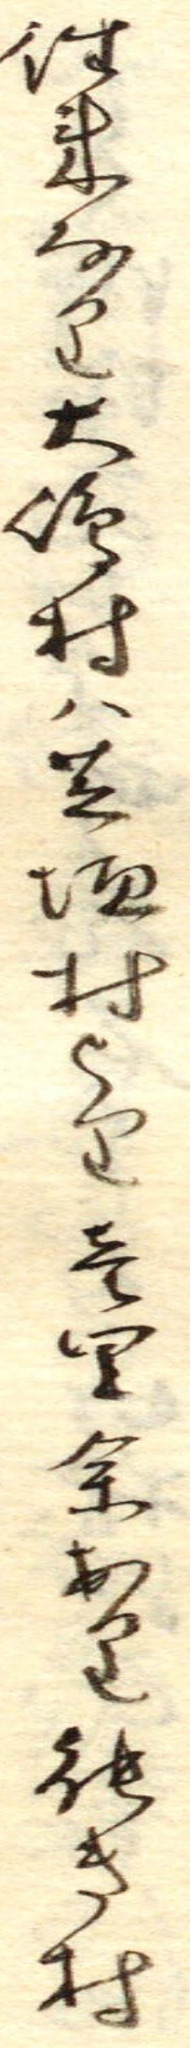往来なり大嶋村は芝垣村より壱里余あり能き村

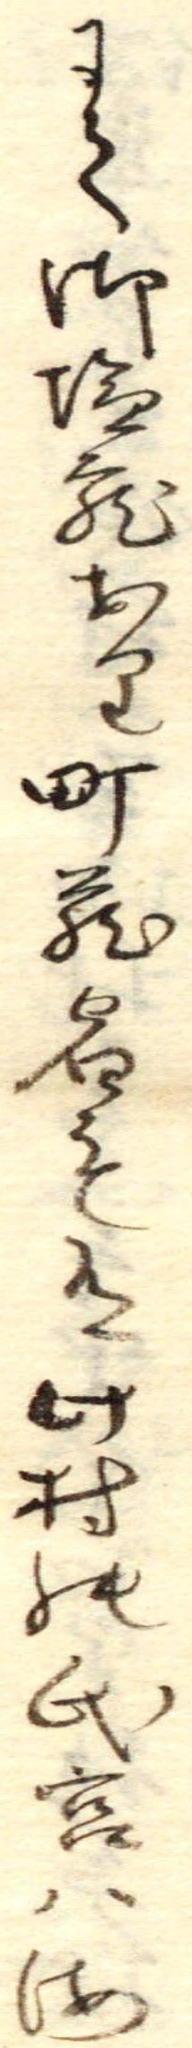にて御塩蔵あり町蔵宿も有此村の氏宮は海
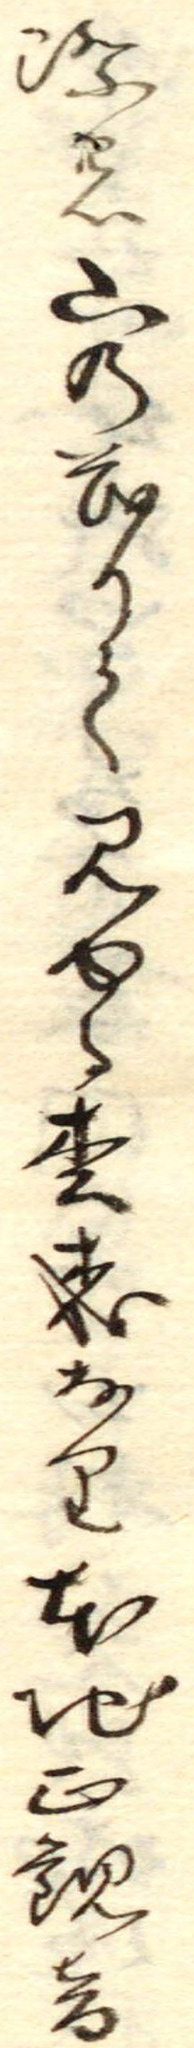際の山の茂りて見ゆる枩森なり本地正観音
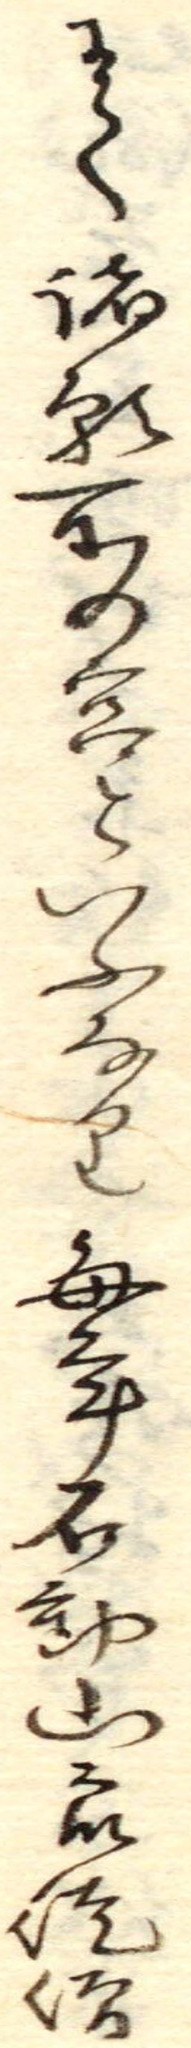にて諸願所の宮といふなり毎年石動山衆徒僧
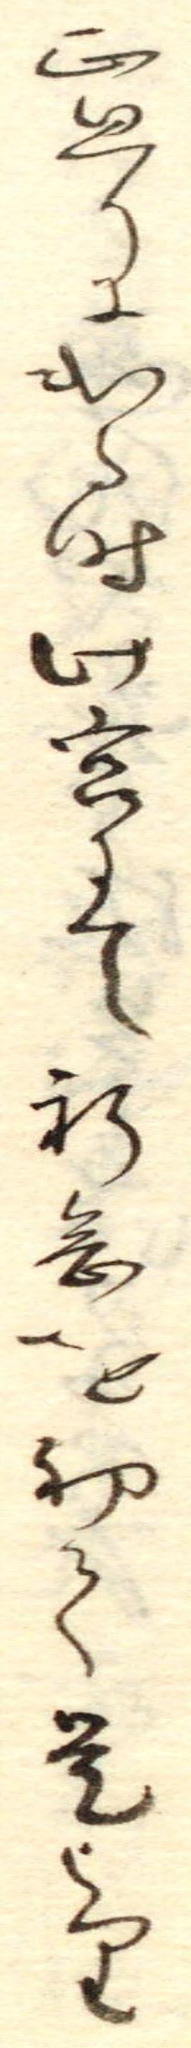正廻りに出る時此宮にて祈念を初て是より
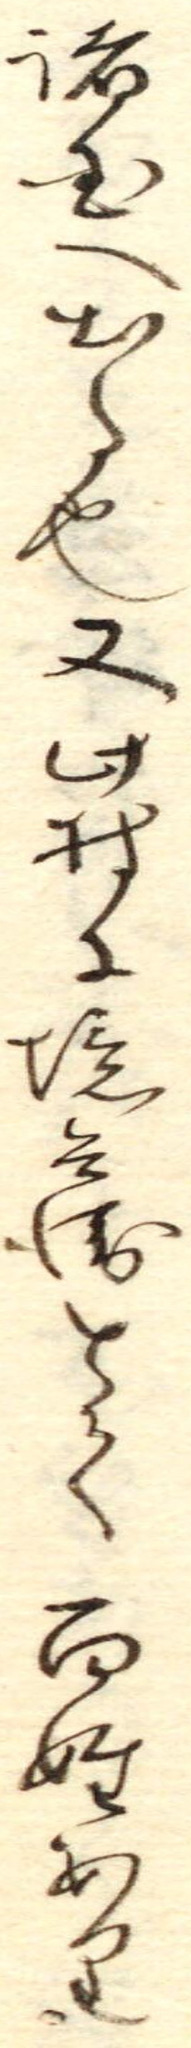諸国へ出る也又此村に境兵衛とて百姓あり
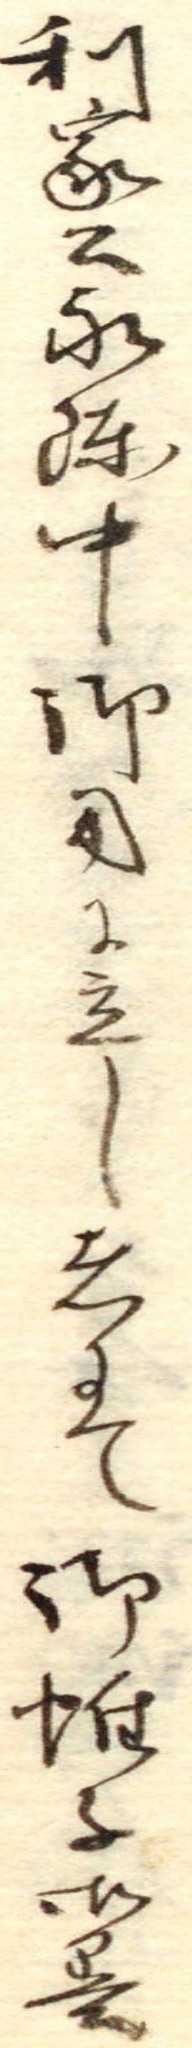利家公永陣中御用に立し者にて御帷子御墨
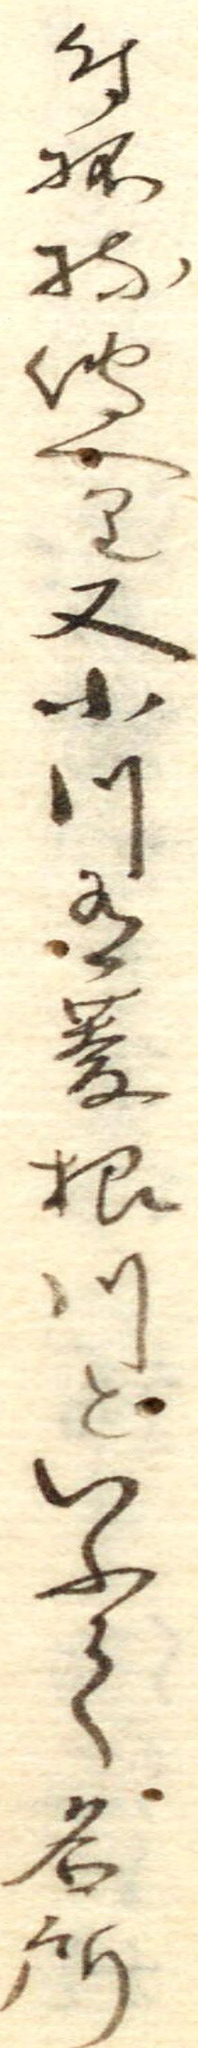付抔持伝へり又小川有菱根川といふて名所
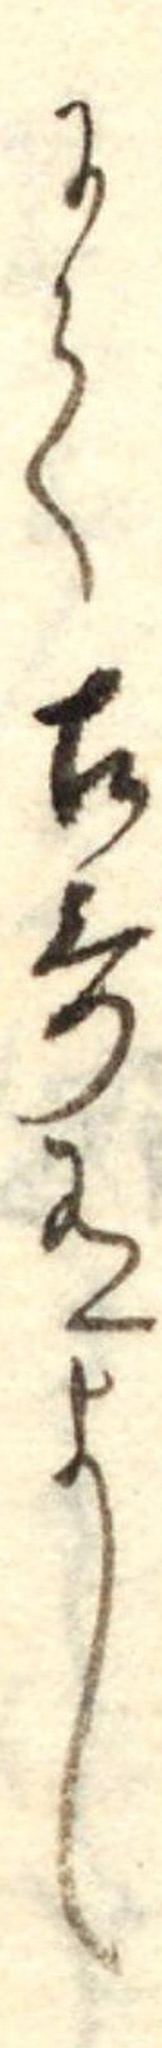にて古哥有よし
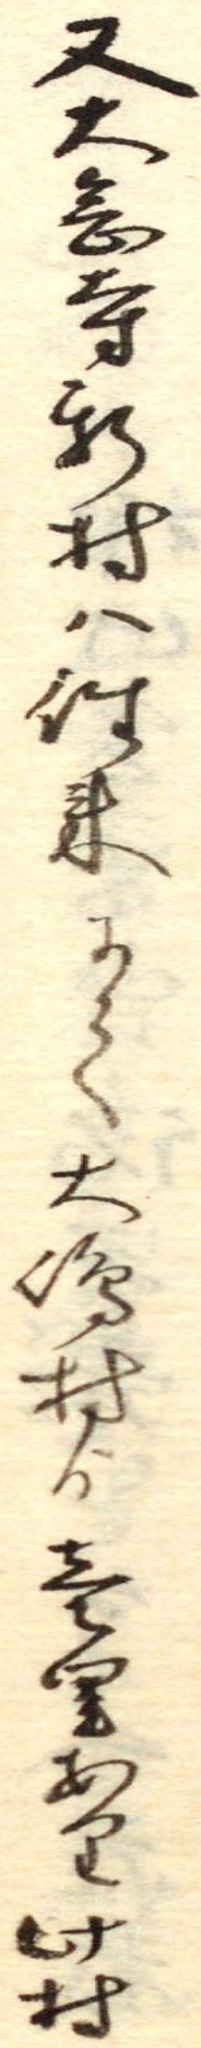又大念寺新村は往来にて大嶋村ゟ壱里あり此村
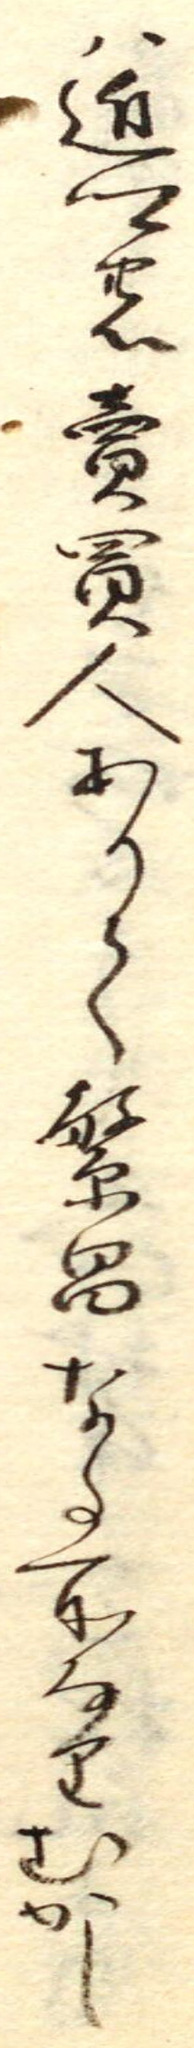は近郷の売買人ありて繁昌なる所なりむかし
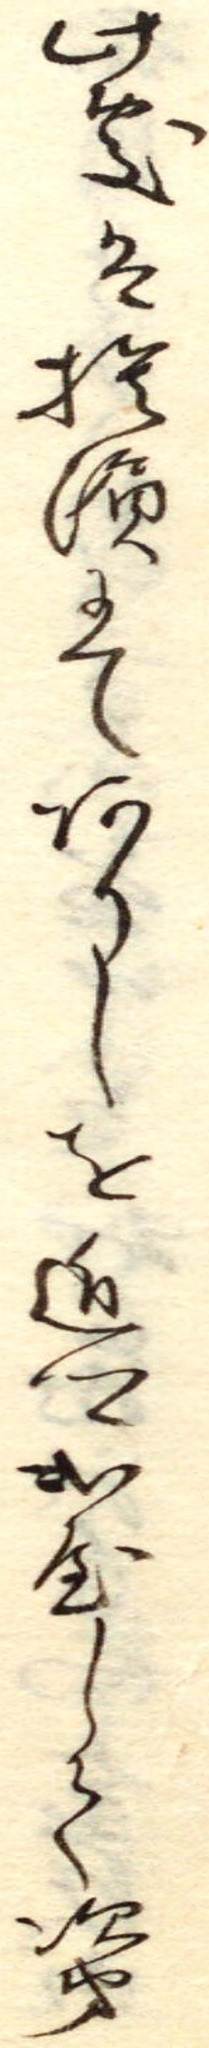此処は捨浜にてありしを近郷出屋して次第
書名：能登名跡誌
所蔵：Ishikawa Prefectural Library
